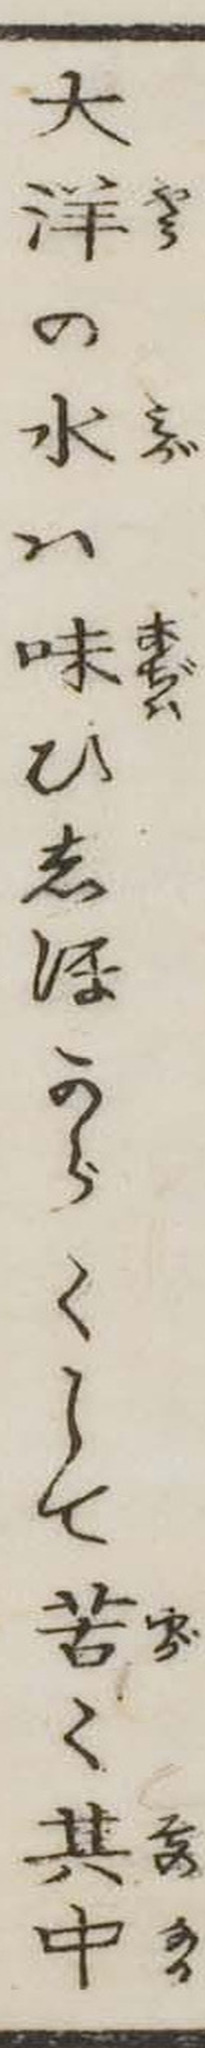大洋の水は味ひしほからくして苦く其中
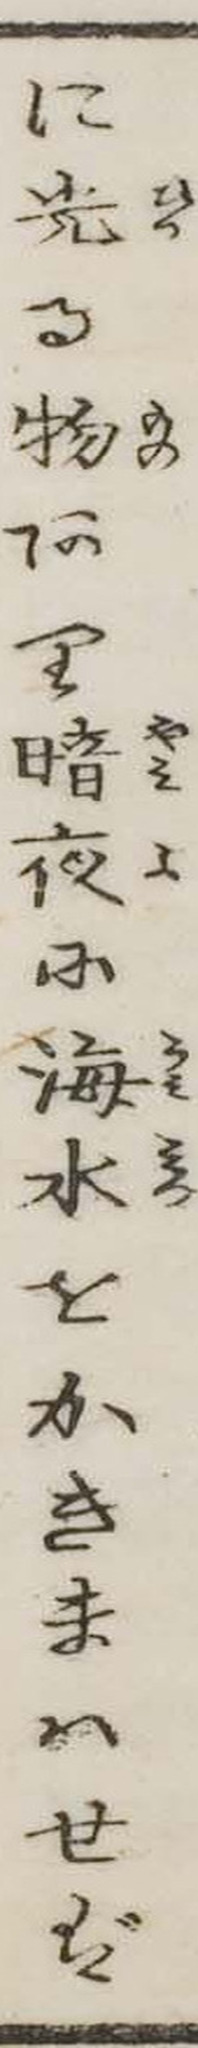に光る物あり暗夜に海水をかきまはせば
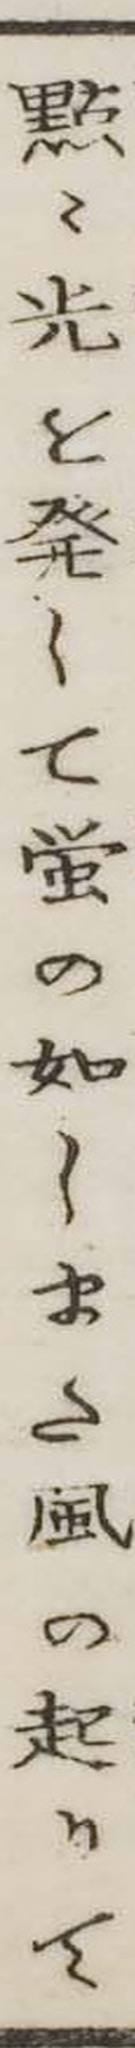點〻光を発して蛍の如しまた風の起りて
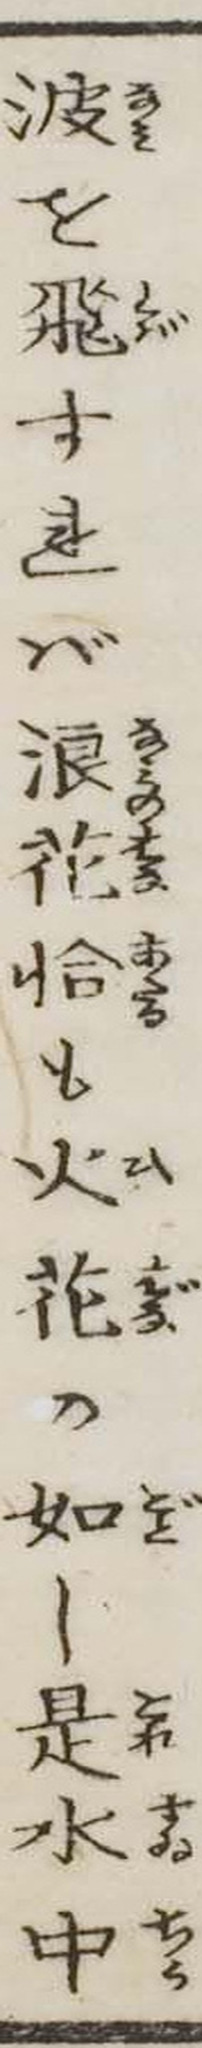波を飛すれば浪花恰も火花の如し是水中
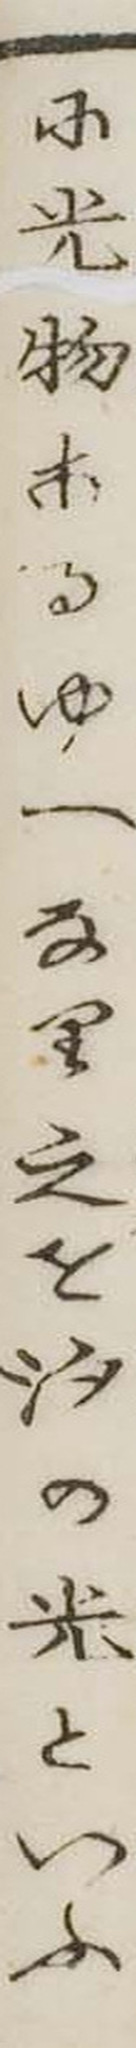に光物あるゆへなり之を汐の光といふ
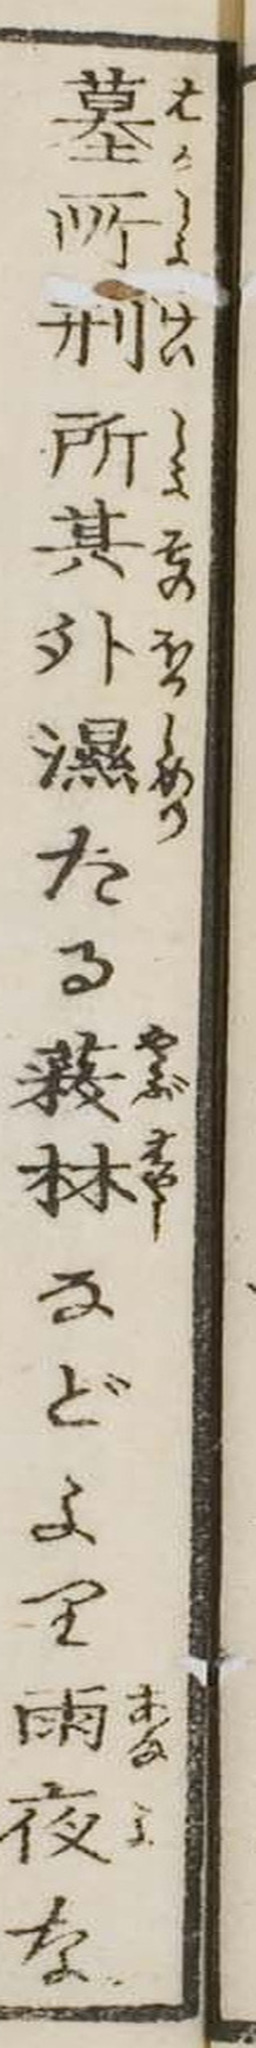墓所刑所其外濕たる薮林などより雨夜な
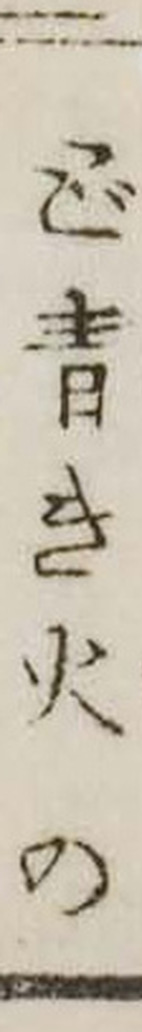ど青き火の
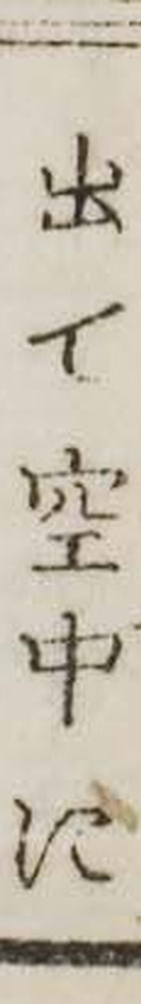出て空中に
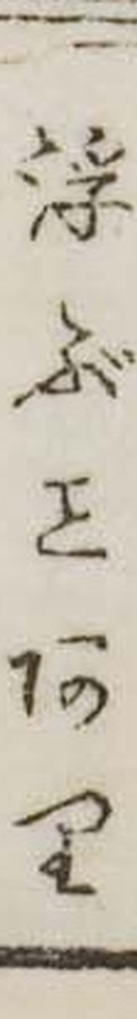浮ぶことあり
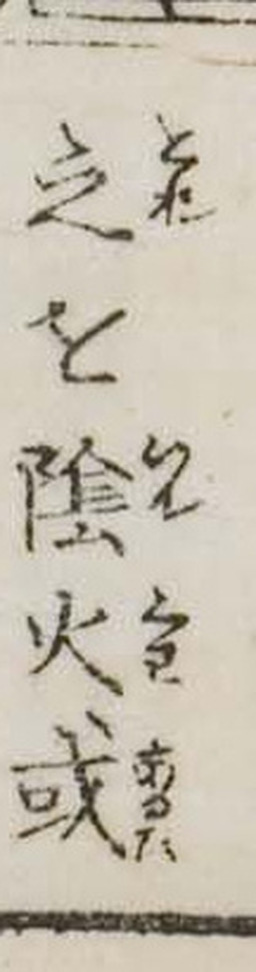之を陰火或
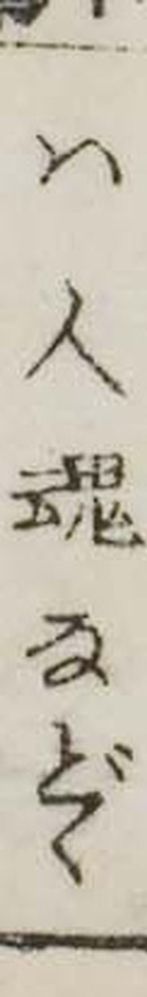は人魂などゝ
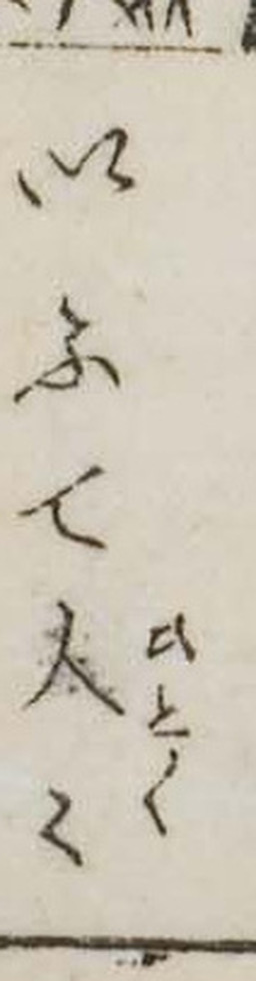いふて人〻
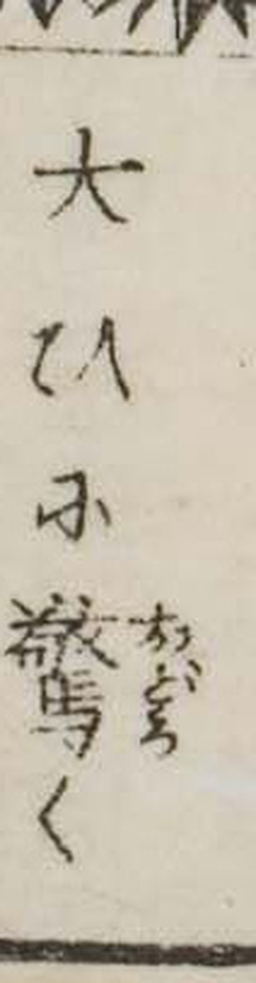大ひに驚く

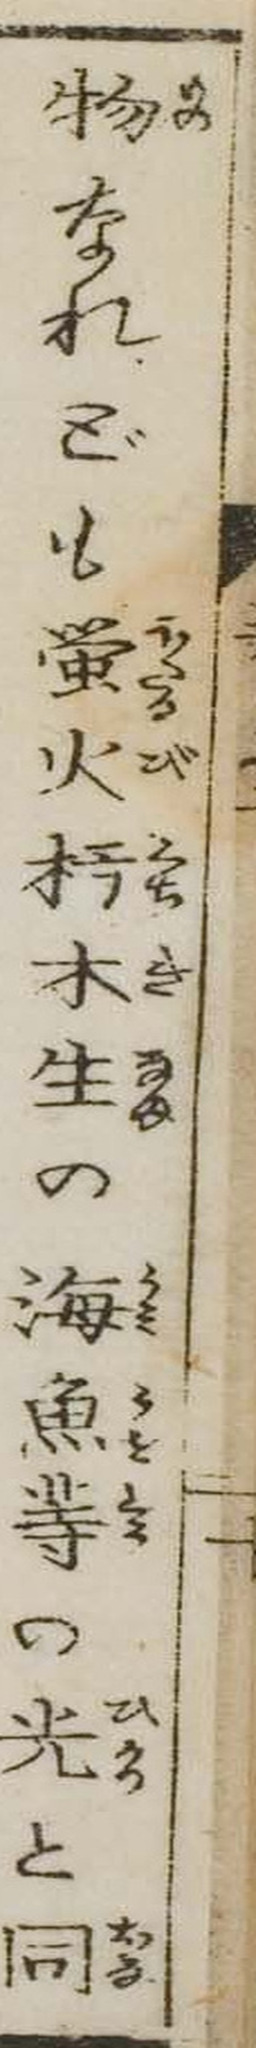物なれども蛍火朽木生の海魚等の光と同
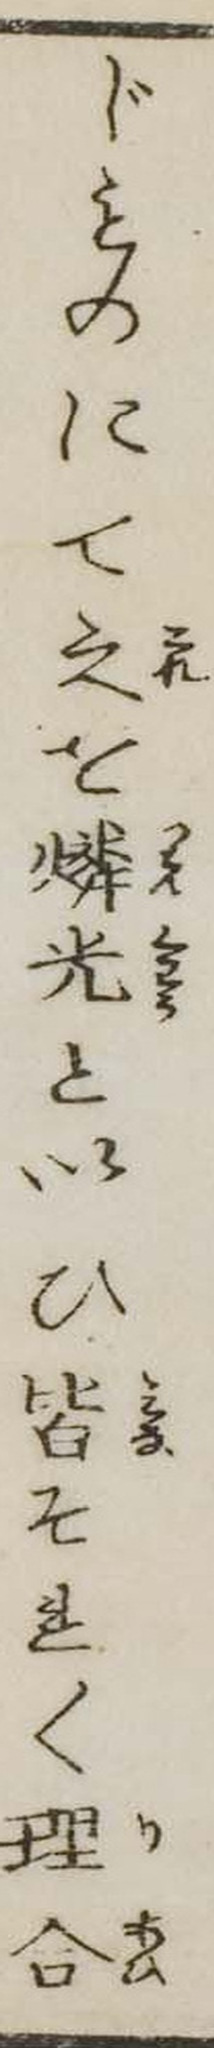じものにて之を燐光といひ皆それ〳〵理合
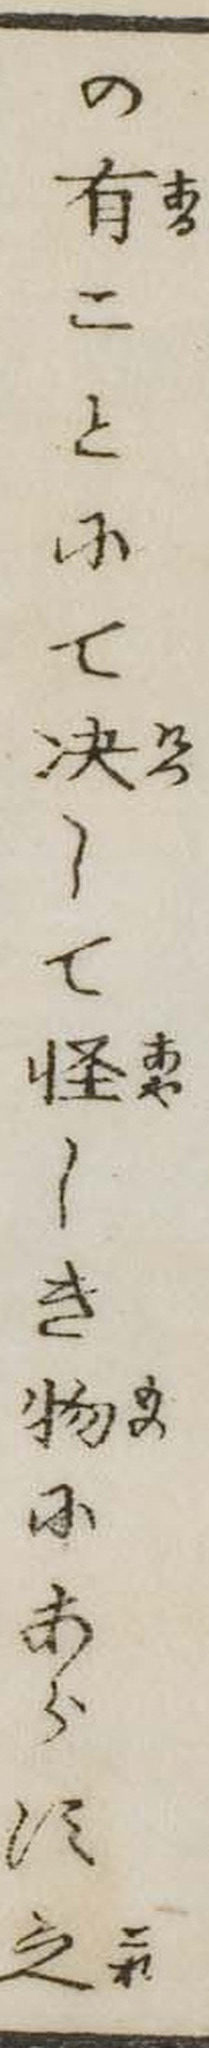の有ことにて決して怪しき物にあらす之
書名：究理知慧の勧 : 訓蒙画入 巻之2
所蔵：東京学芸大学附属図書館
